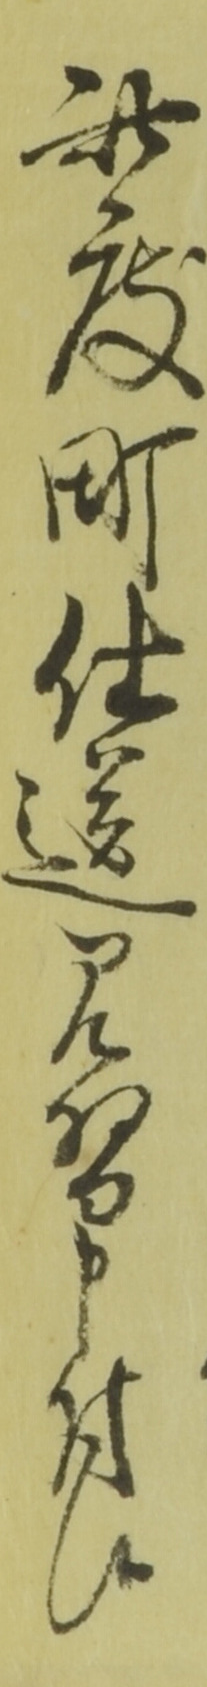此度町仕送見習申付候
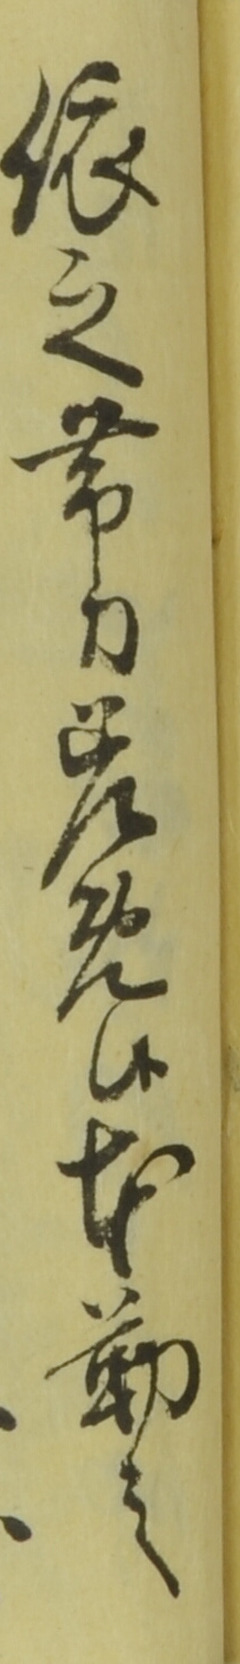依之帯刀差免候本勤之
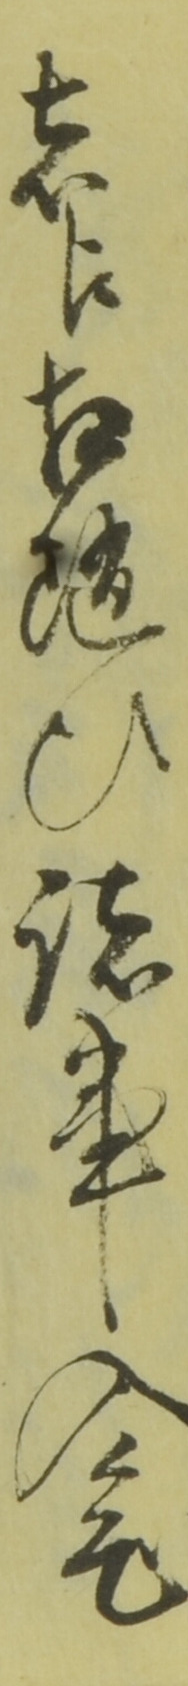者江相随ひ諸事入念
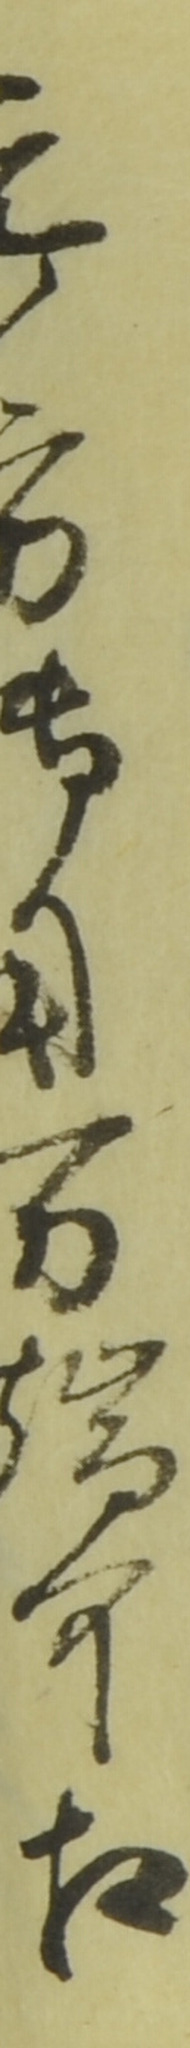元〆方御用万端可相

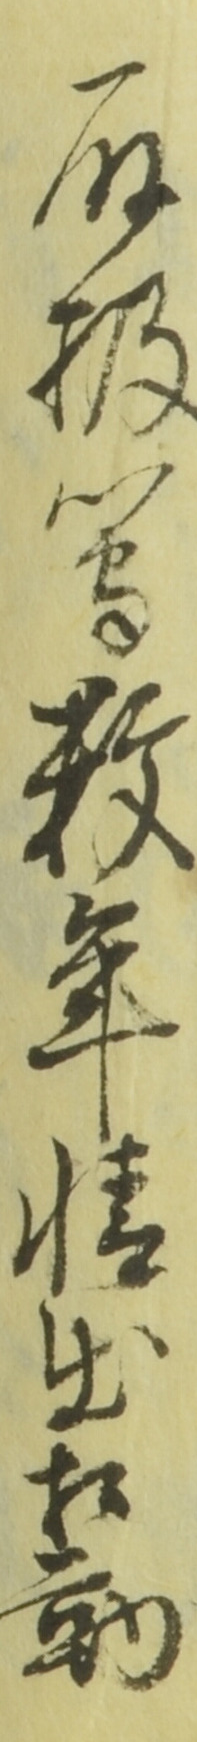取扱等数年精出相勤
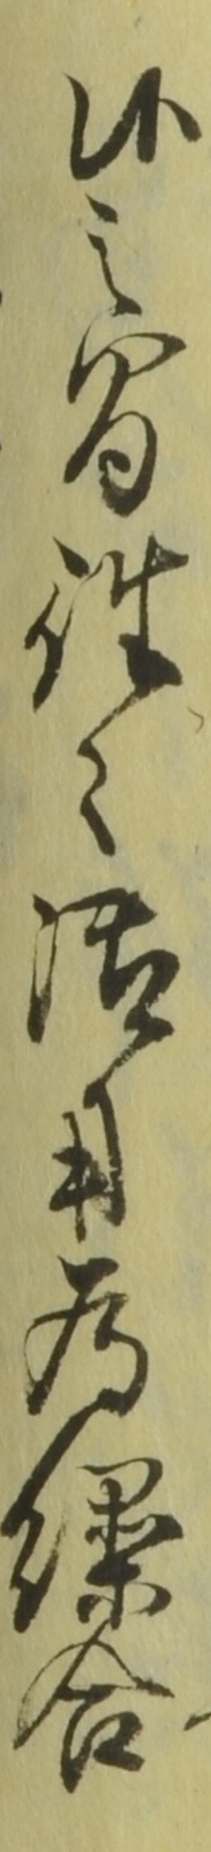候之間往々御用為繰合
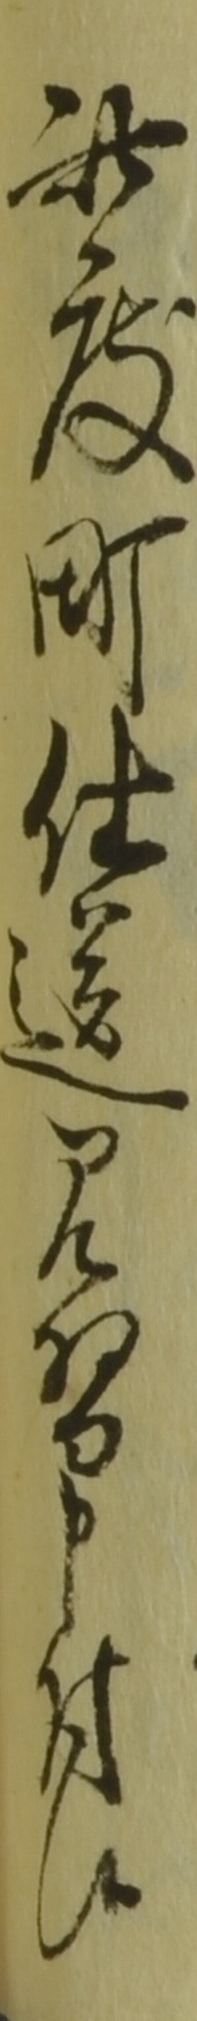此度町仕送見習申付候
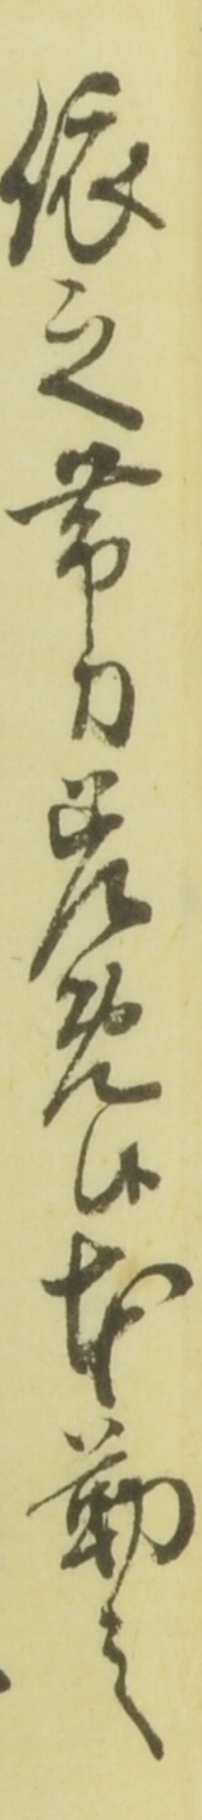依之帯刀差免候本勤之
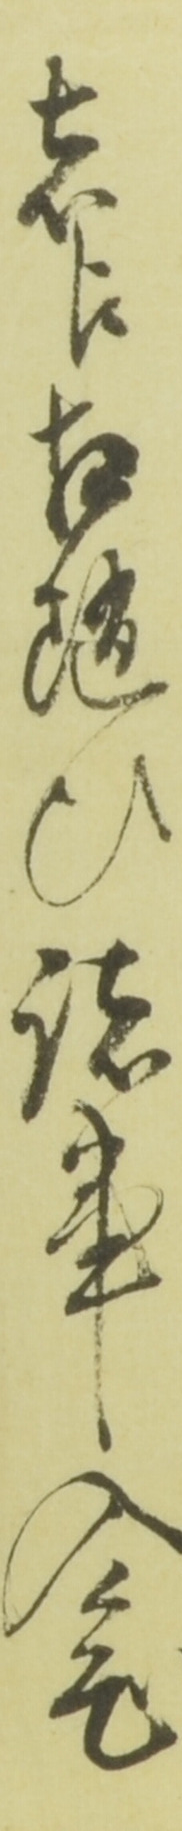者江相随ひ諸事入念
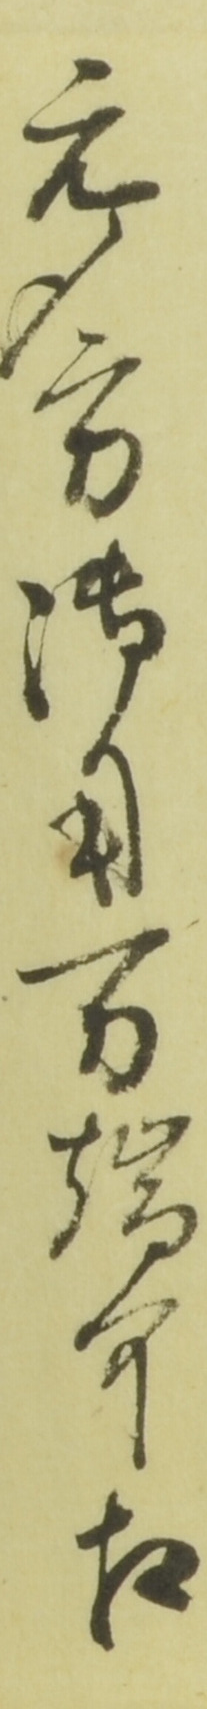元〆方御用万端可相
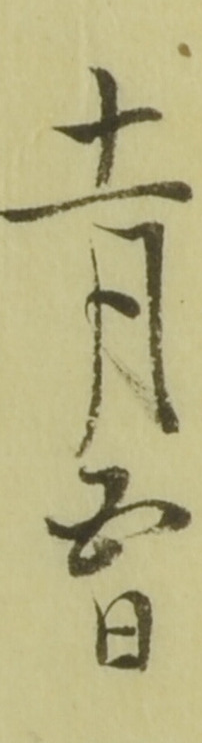十一月五日
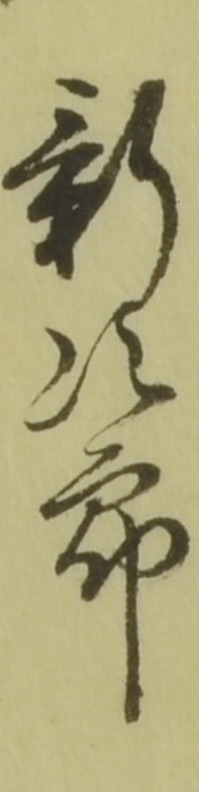新次郎
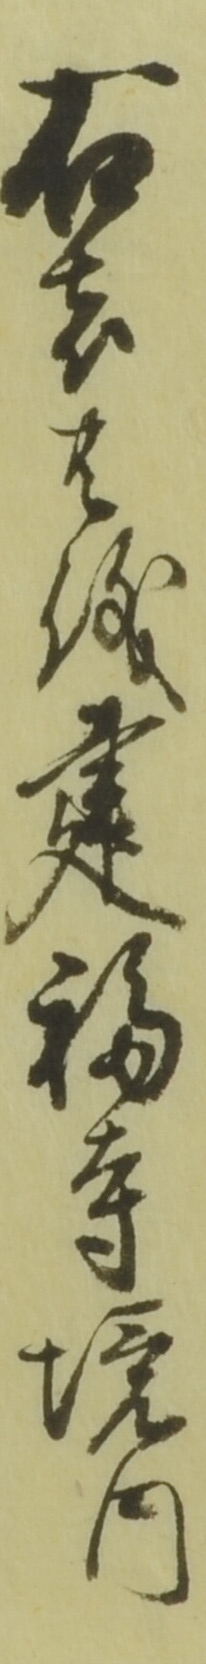右者共儀建福寺境内
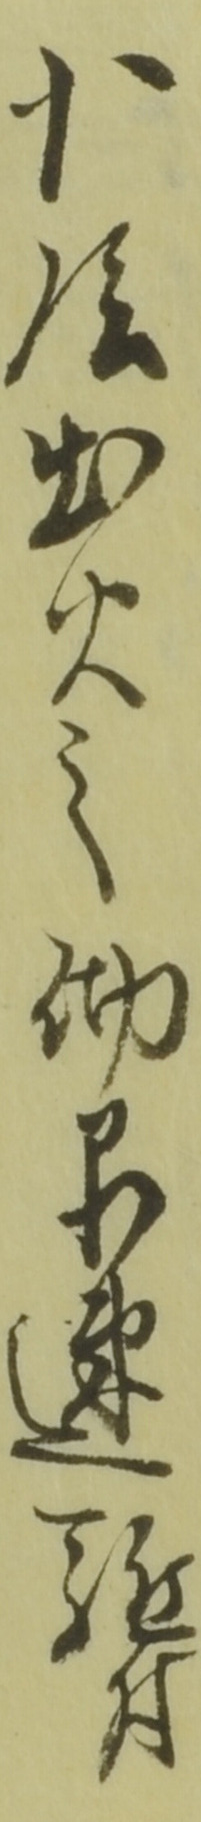小屋出火之砌早速馳付
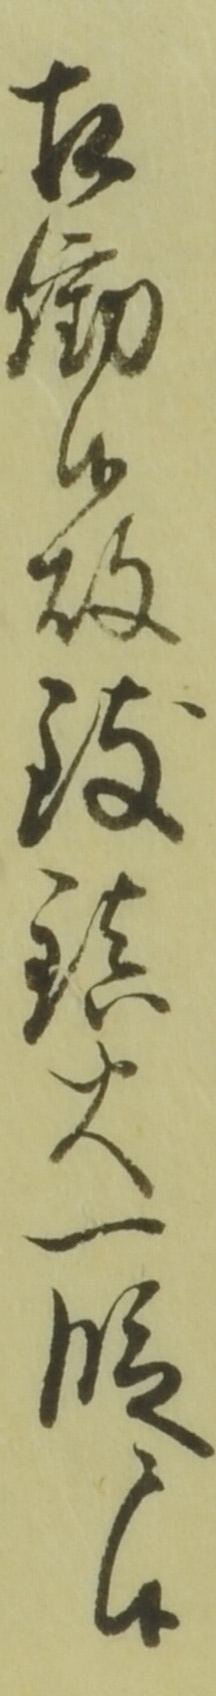相働候故致鎮火一段ニ候
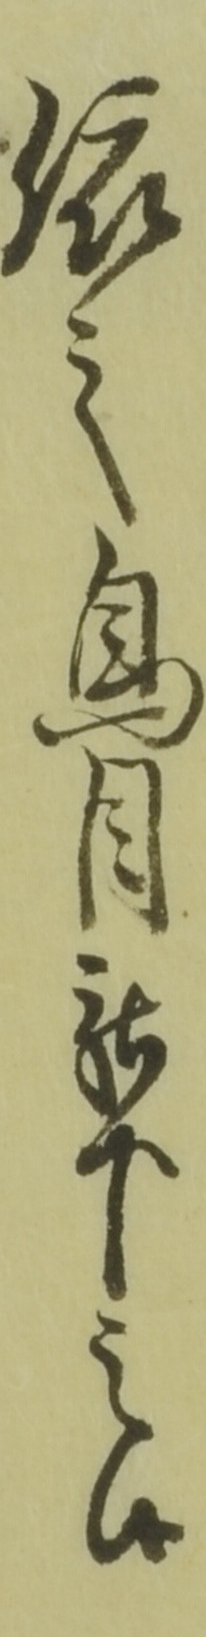依之鳥目被下之候
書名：御触書御書附控
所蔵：伊那市立高遠町図書館・合同会社AMANE
